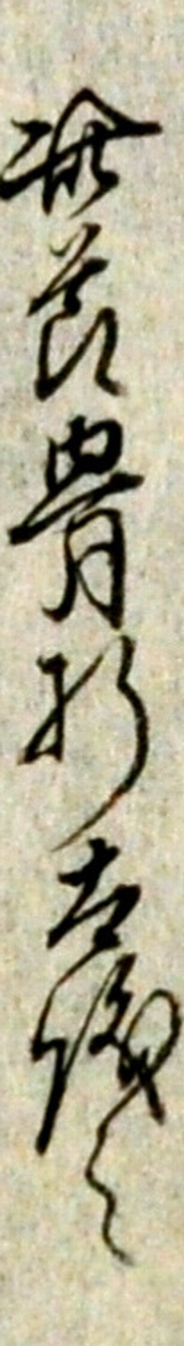此節骨折太儀之
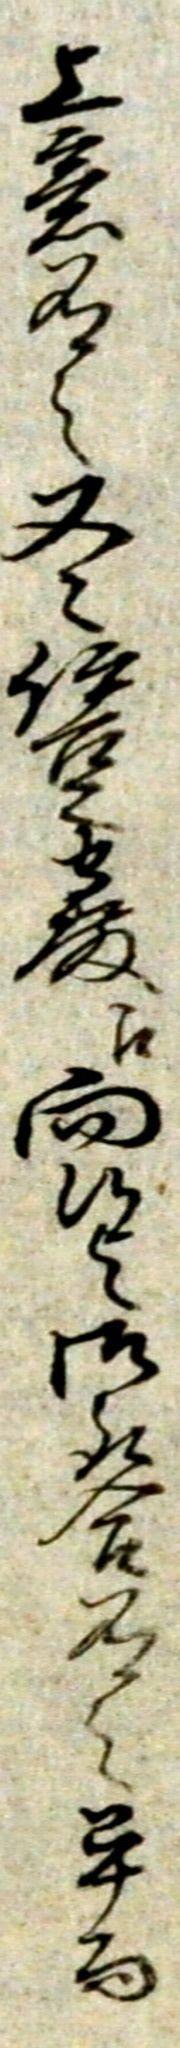上意有之又々伊豆守殿江向候と御取合有之畢而
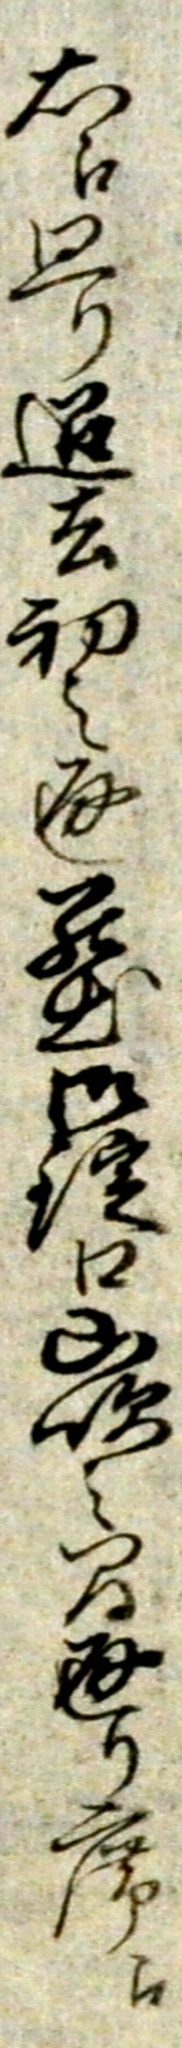右江廻り退去初之通罷出御錠口山吹之間通り席江
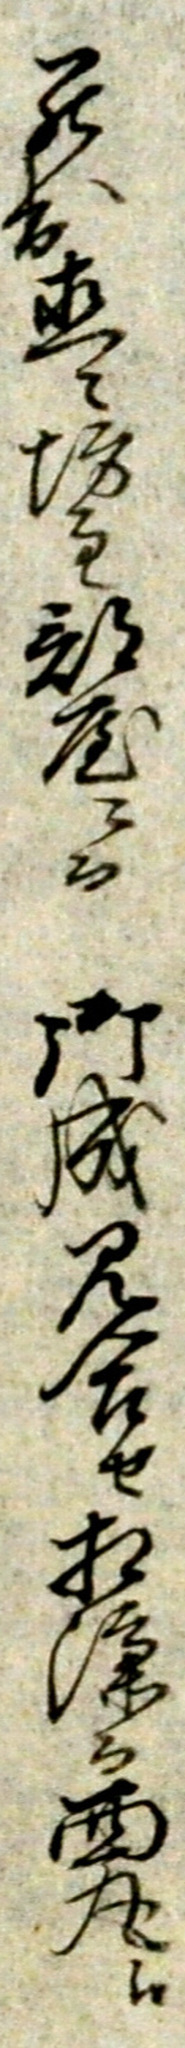罷出直ニ坊主部屋ニ而御成見合せ相済而西丸江
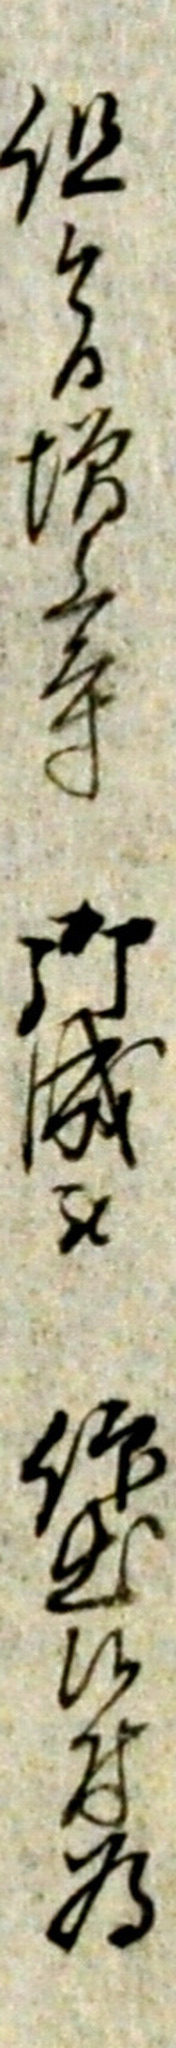但今日増上寺御成被仰出候付為
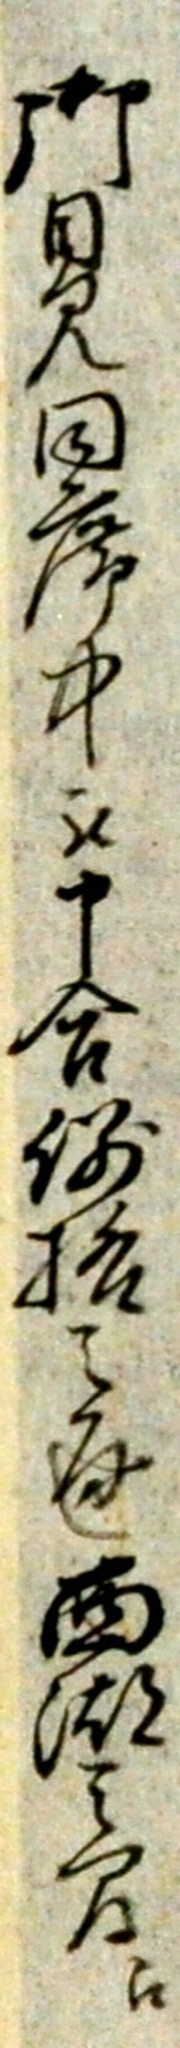御目見同席中被申合例格之通西湖之間江

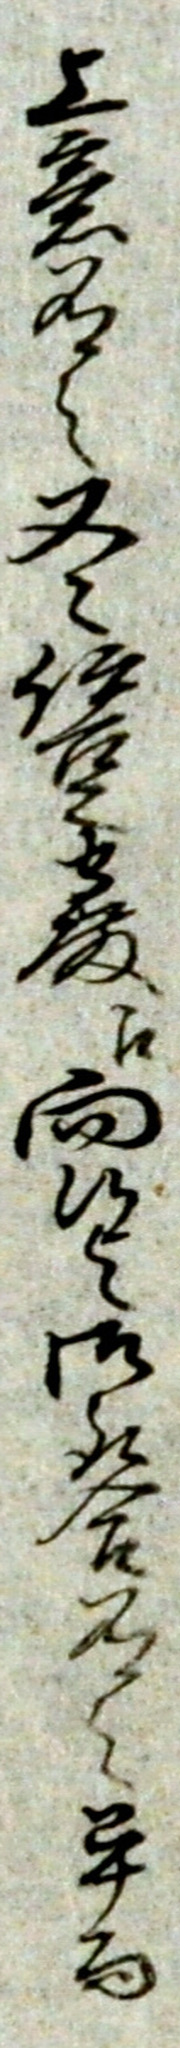上意有之又々伊豆守殿江向候与御取合有之畢而
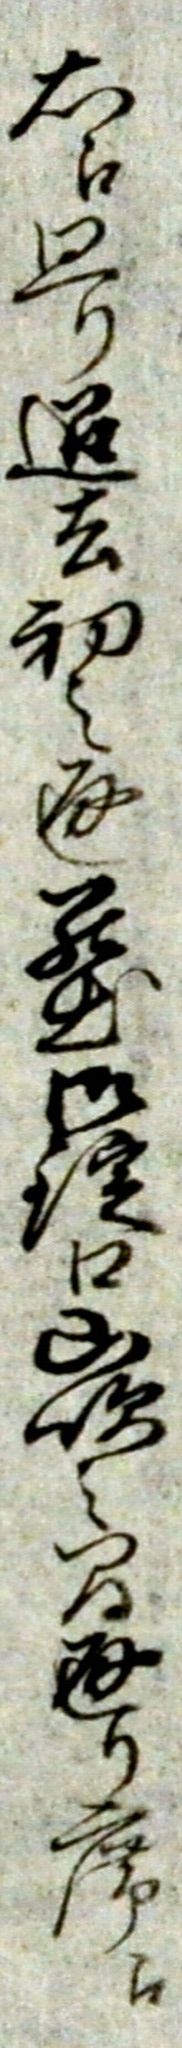右江廻り退去初之通罷出御山吹之間通席江
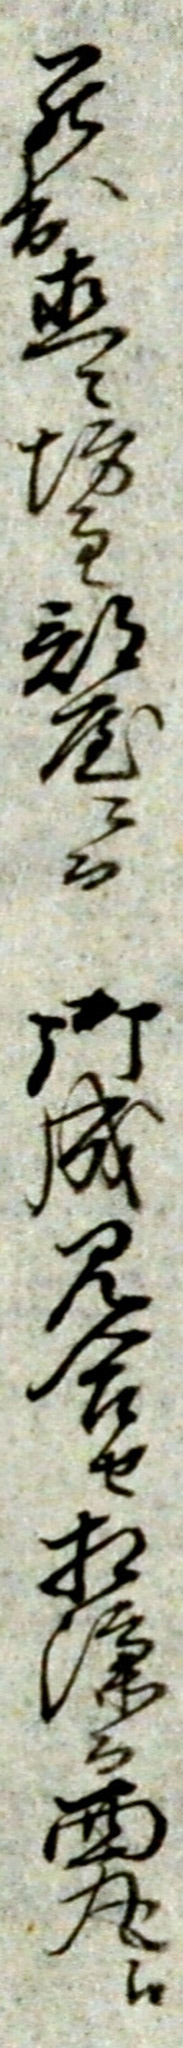罷出直ニ坊主部屋ニ而御成見合セ相済而西丸江
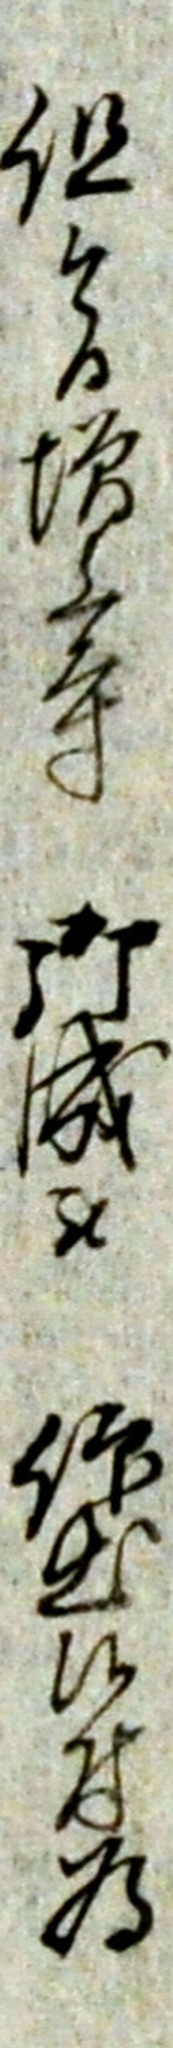但今日増上寺御成被仰出候付為
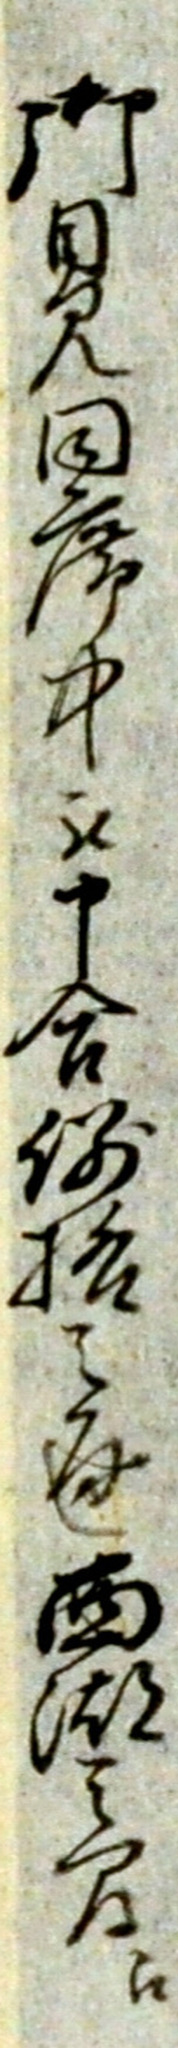御目見同席中被申合例格之通西湖之間江
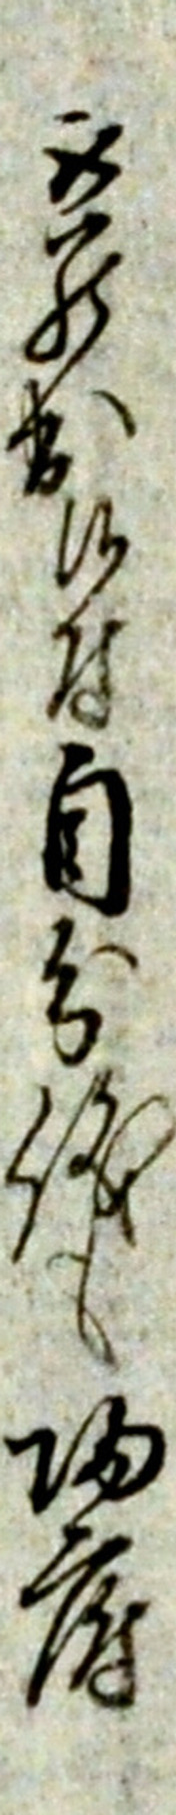被罷出候付自分儀も帰府
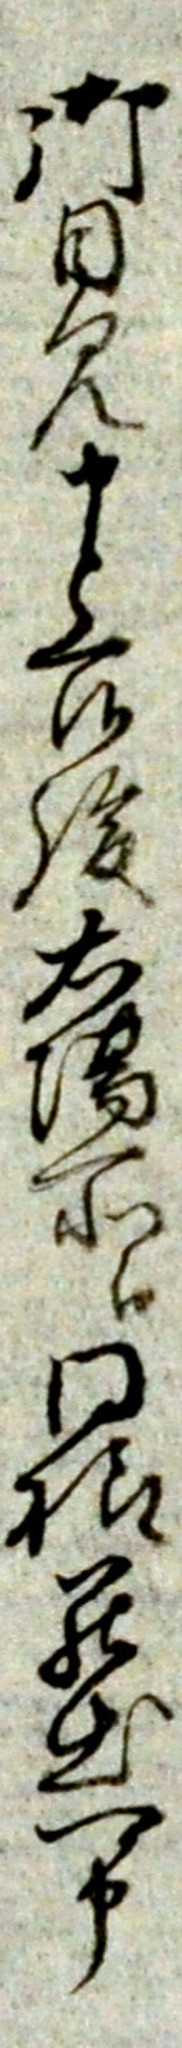御目見申上候後右場所江同様罷出可申
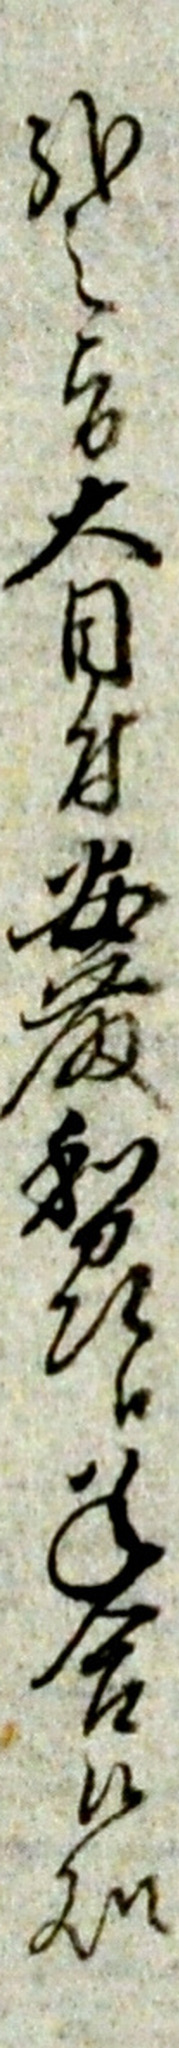哉之旨大目付安藤和州え承合候処
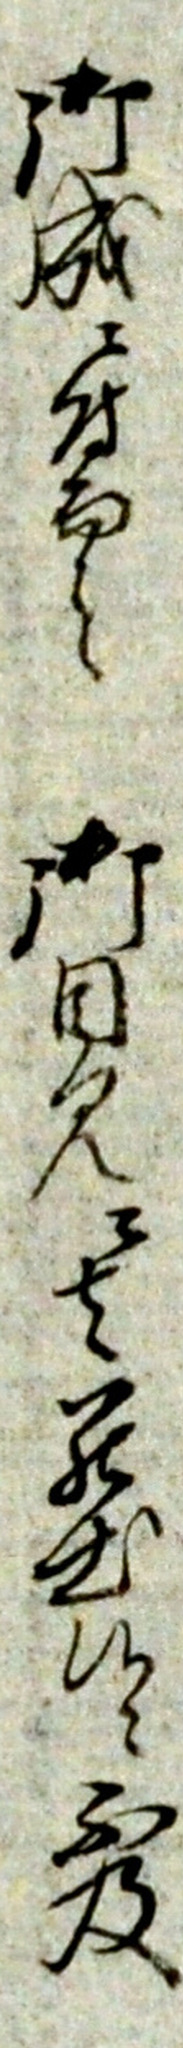御成ニ付而之御目見ニ者罷出候ニ不及
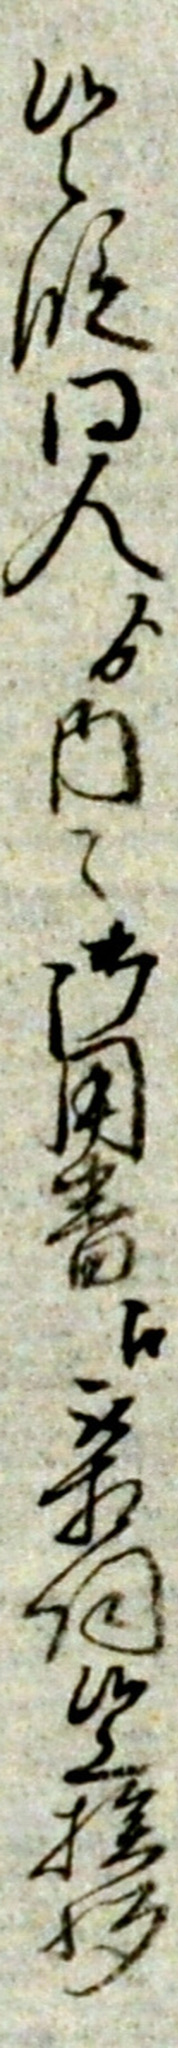候之段同人ゟ内々御用番江被相伺候上挨拶
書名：日光御名代相勤候節ノ留
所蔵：伊那市立高遠町図書館・合同会社AMANE
